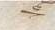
Es wird
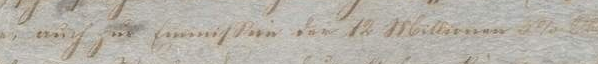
auch zur Emmißion der 12 Millionen 5% Obligationen
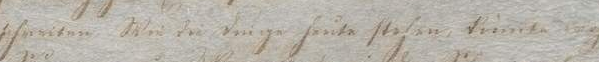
schreiten. Wie die Dinge heute stehen, könnte wohl die gan-
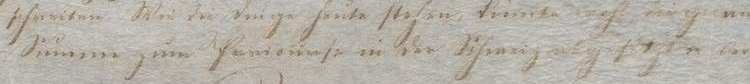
Summe zum Paricurse in der Schweiz abgesetzt werden.
